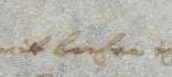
Anmit beehre ich
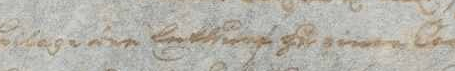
Beilage den Entwurf zu einer
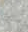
wie
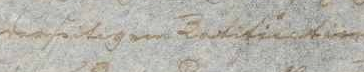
derseitigem Ratificationsvorbehalte
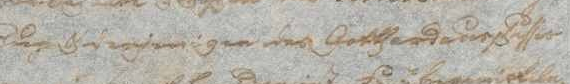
des h. Regierungsrathes von Zug & derjenigen
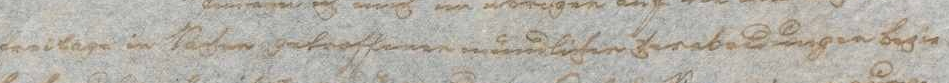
Freitage in Sachen getroffenen mündlichen Verabredungen bezie-
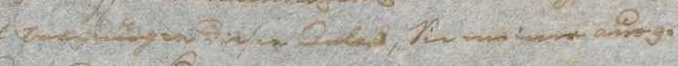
benutze ich mit Vergnügen diesen Anlaß, Sie meiner ausge-
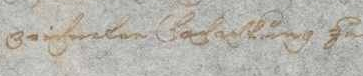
Hochachtung zu versichern.
